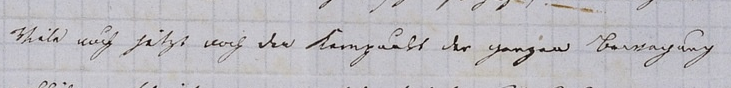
Viele auch jetzt noch den Kernpunkt der ganzen Bewegung
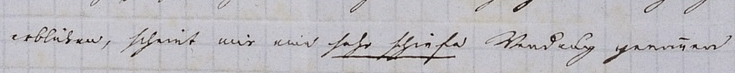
erblicken, scheint mir eine sehr schiefe Wendung genommen
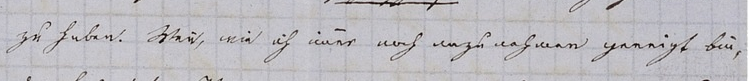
zu haben. Wenn, wie ich immer noch anzunehmen geneigt bin,
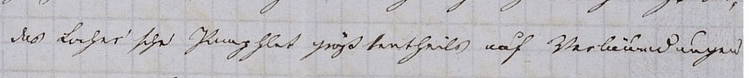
das Locher'sche Pamphlet größtentheils auf Verläumdungen
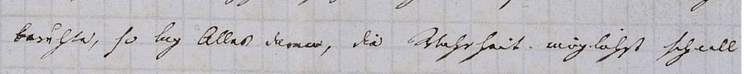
beruhte, so lag Alles daran, die Mehrheit möglichst schnell
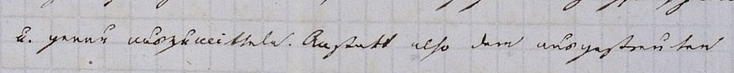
u. genau auszumitteln. Anstatt also dem ausgestreuten
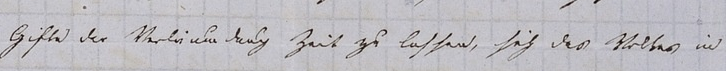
Gifte der Verläumdung Zeit zu lassen, sich des Volkes in
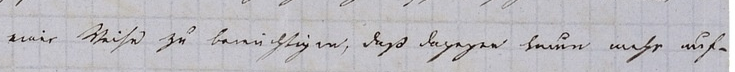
einer Weise zu bemächtigen, daß dagegen kaum mehr auf-
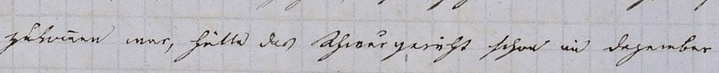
zukommen war, hätte das Schwurgericht schon im Dezember
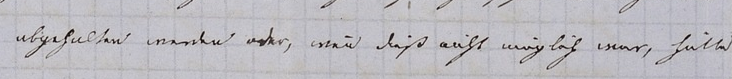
abgehalten werden oder, wenn dieß nicht möglich war, hätte
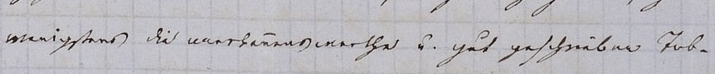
wenigstens die anerkennenswerthe u. gut geschriebne Tob-
